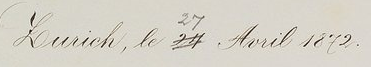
Zurich, le 2427 Avril 1872.
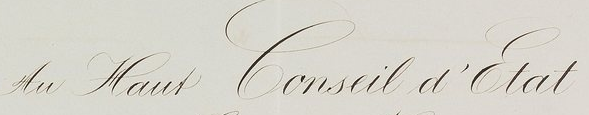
Au Haut Conseil d'Etat
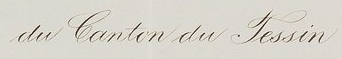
du Canton du Tessin
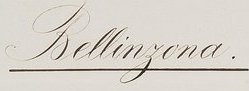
Bellinzona.
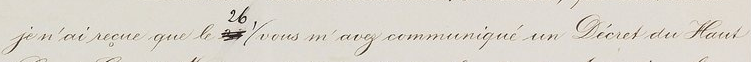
je n'ai reçue que le 3126, (vous m'avez communiqué un Décret du Haut
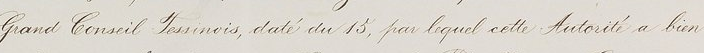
Grand Conseil Tessinois, daté du 15, par lequel cette Autorité a bien
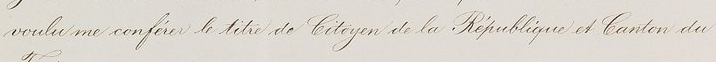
voulu me conférer le titre de Citoyen de la République et Canton du
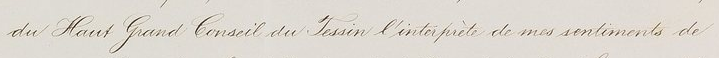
du Haut Grand Conseil du Tessin l'interprète de mes sentiments de
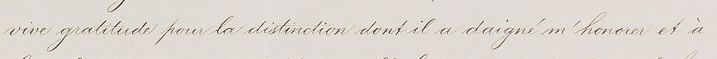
vive gratitude pour la distinction dont il a daigné m'honorer et à
